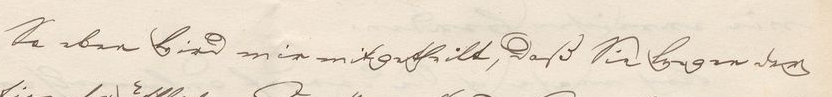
So eben wird mir mitgetheilt, daß Sie wegen der
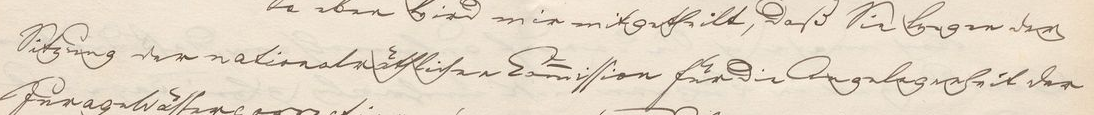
Sitzung der nationalräthlichen Commission für die Angelegenheit der
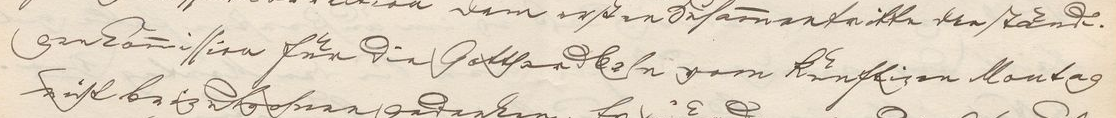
gen Commission für die Gotthardbahn vom künftigen Montag
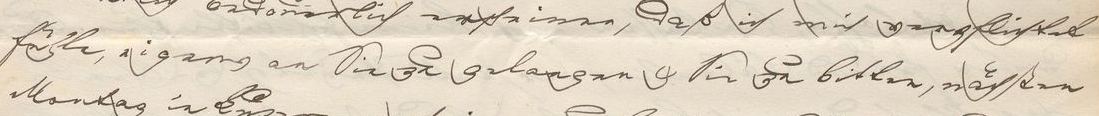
fühle, eigens an Sie zu gelangen & Sie zu bitten, nächsten
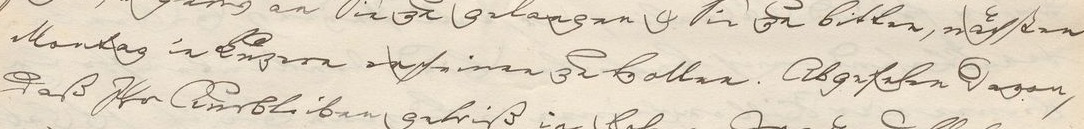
Montag in Luzern erscheinen zu wollen. Abgesehen davon,
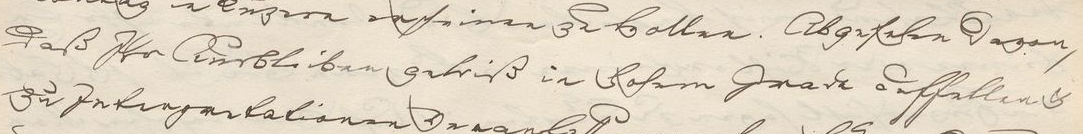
daß Ihr Ausbleiben gewiß in hohem Grade auffallen &
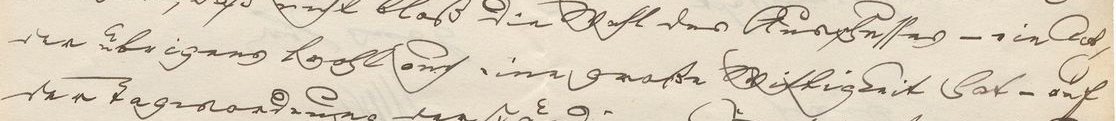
der übrigens wohl auch eine große Wichtigkeit hat – auf
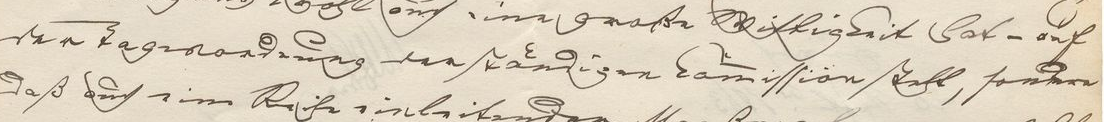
der Tagesordnung der ständigen Commission steht, sondern
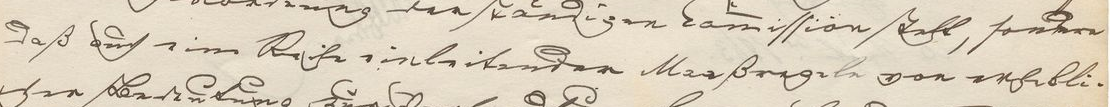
daß auch eine Reihe einleitender Maaßregeln von erhebli-
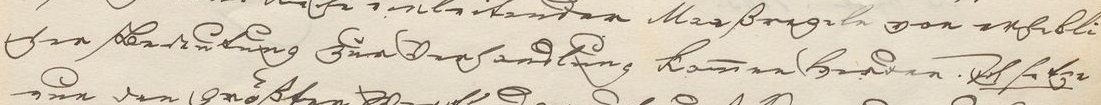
cher Bedeutung zu Verhandlung kommen werden. Ich setze
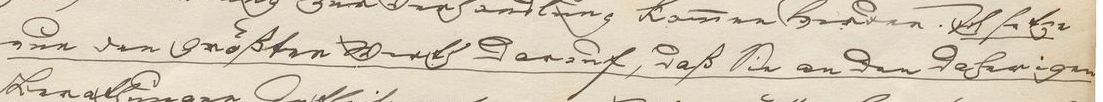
nun den größten Werth darauf, daß Sie an den daherigen
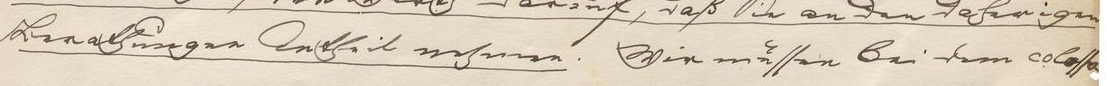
Berathungen Antheil nehmen. Wir müssen bei dem colossa-
